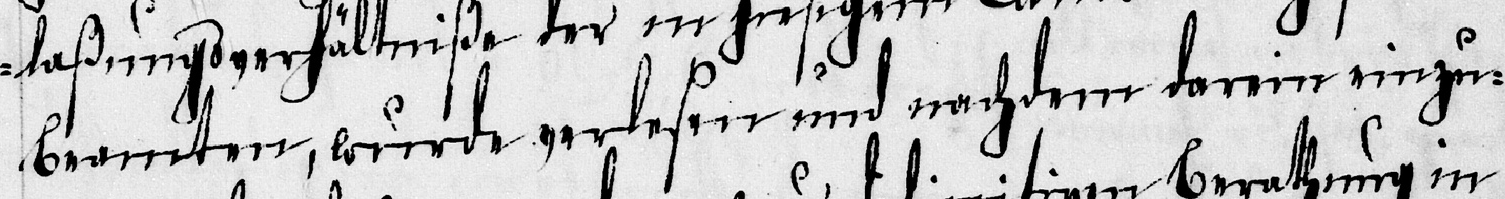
Beamten, wurde verlesen und nachdem darein einzu¬
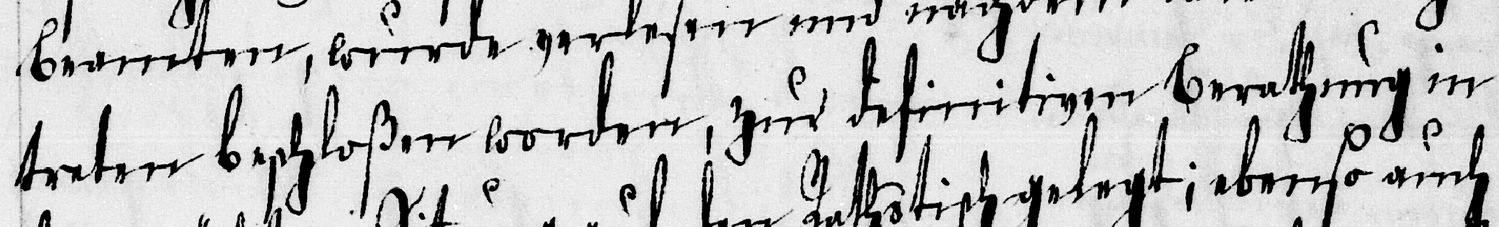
treten beschloßen worden, zur definitiven Berathung in
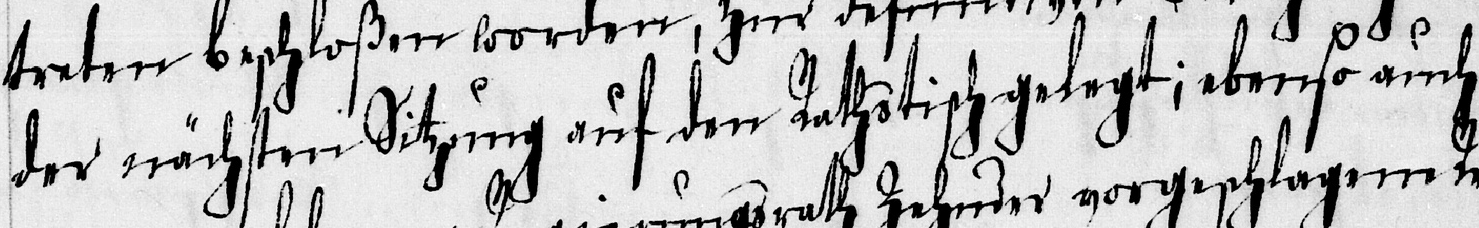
der nächsten Sitzung auf den Rathstisch gelegt; ebenso auch
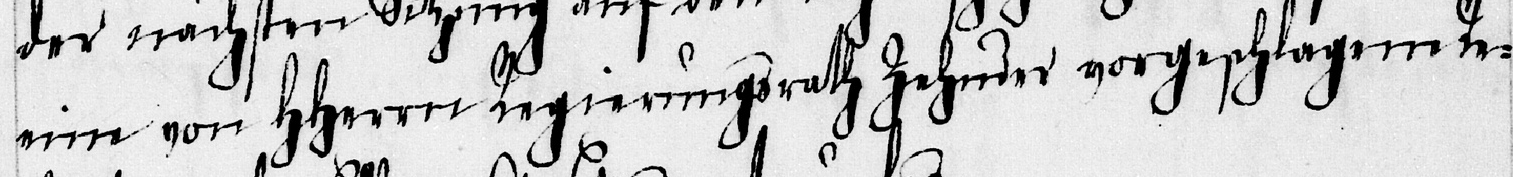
eine von HHerrn Regierungsrath Zehnder vorgeschlagene Re¬
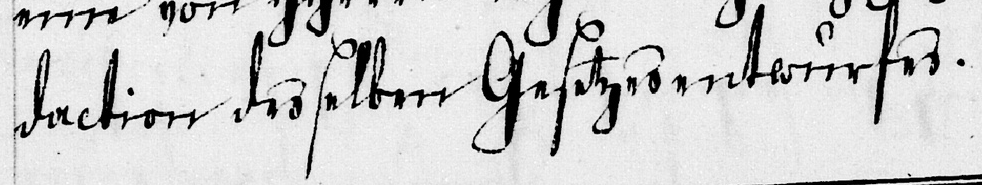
daction desselben Gesetzesentwurfes.
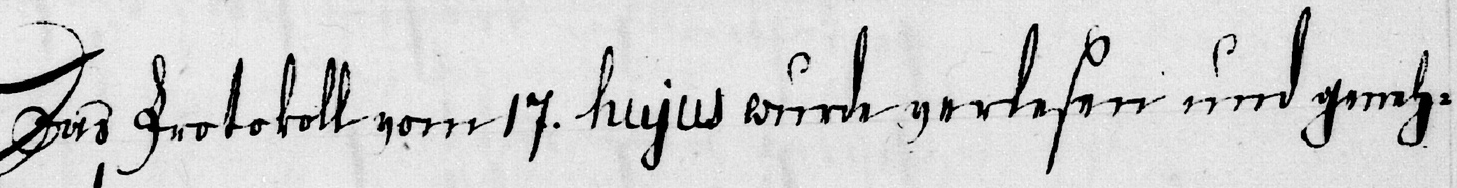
Das Protokoll vom 17. hujus wurde verlesen und geneh¬
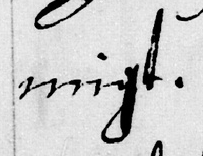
migt.
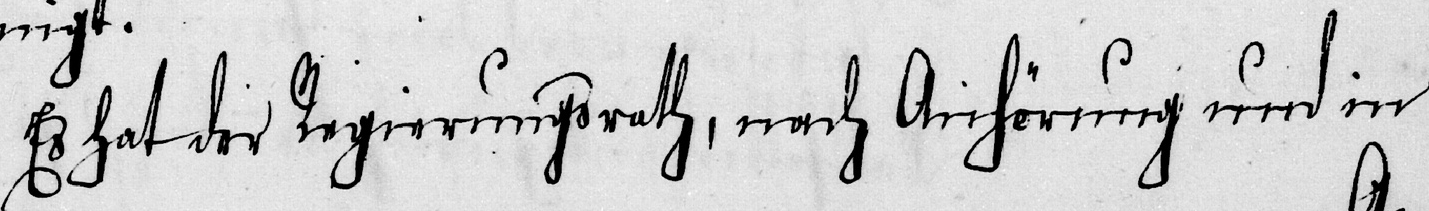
Es hat der Regierungsrath, nach Anhörung und in
